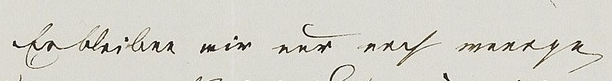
Es bleiben mir nur noch wenige
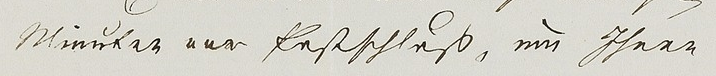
Minuten vor Postschluß, um Ihnen
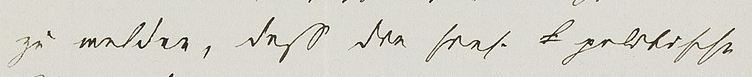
zu melden, daß die hies. & politische
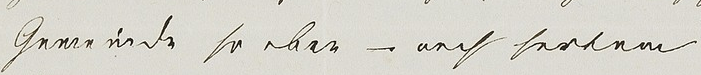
Gemeinde so eben – nach hartem
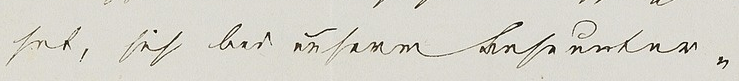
hat, sich bei unserm Bahnunter-
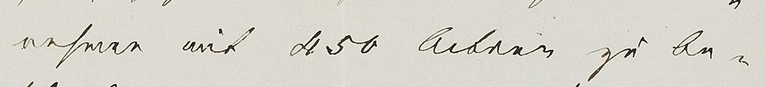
nehmen mit 450 Actien zu be-
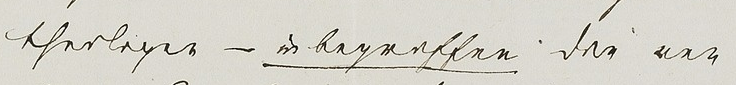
theiligen – inbegriffen die von
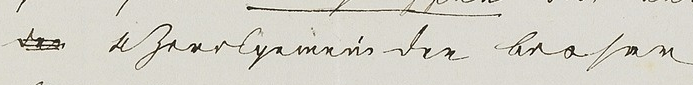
der 4 Zivilgemeinden bisher
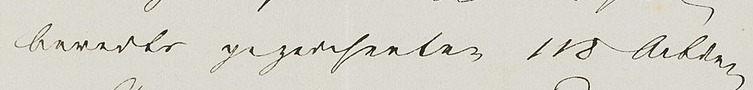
bereits gezeichneten 118 Actien
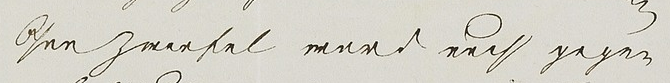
Ohne Zweifel wird auch gegen
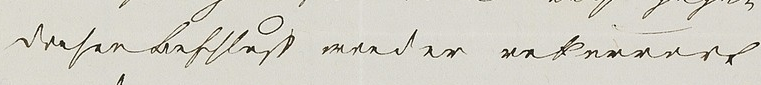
diesen Beschluß wieder rekurrirt
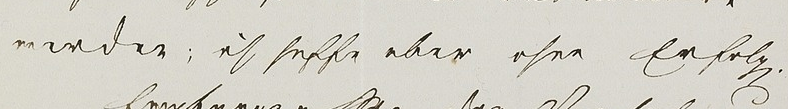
werden; ich hoffe aber ohne Erfolg.
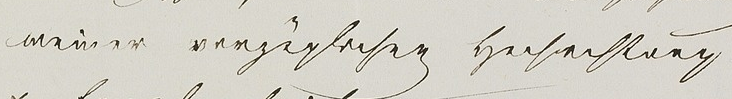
meiner vorzüglichen Hochachtung
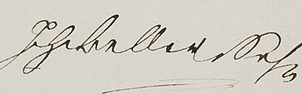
J. H. Boller, Sohn
